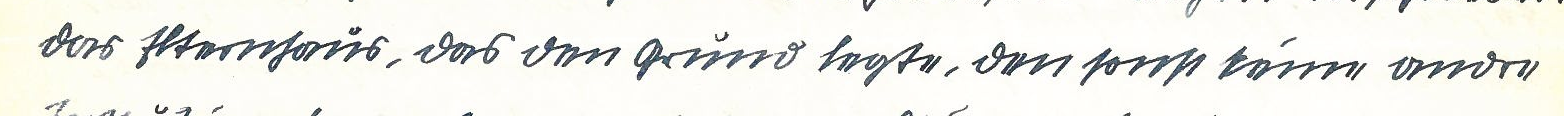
das Elternhaus, das den Grund legte, den sonst keine andre
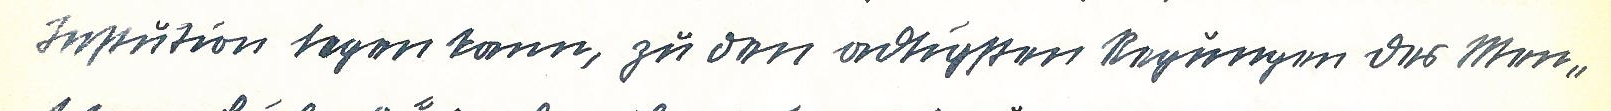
Institution legen kann, zu den adligsten Regungen des Men¬
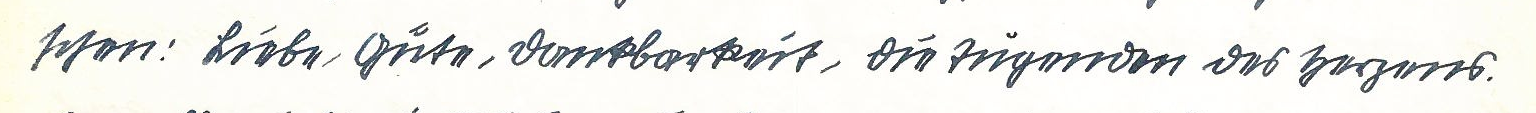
schen: Liebe, Güte, Dankbarkeit, die Tugenden des Herzens.
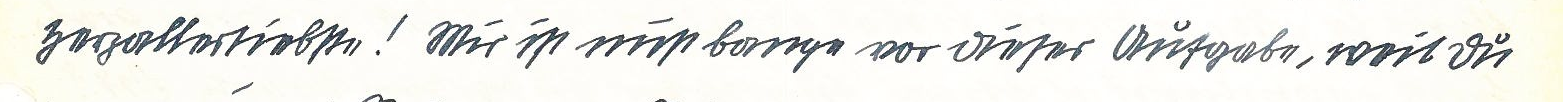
Herzallerliebste! Mir ist nicht bange vor dieser Aufgabe, weil Du
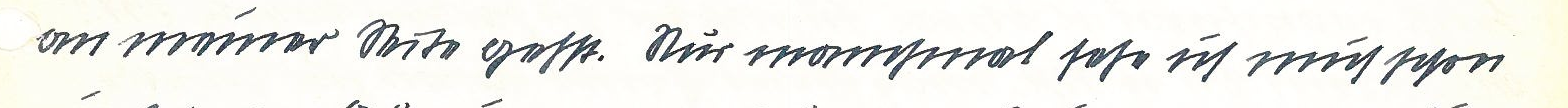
an meiner Seite gehst. Nur manchmal sehe ich mich schon
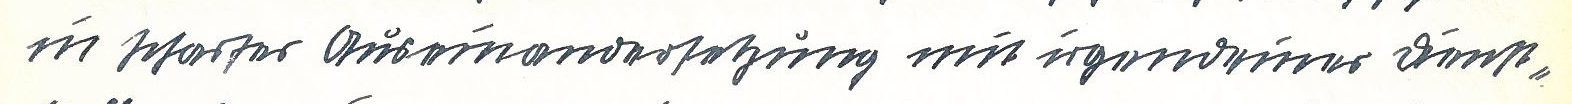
in scharfer Auseinandersetzung mit irgendeiner Dienst¬
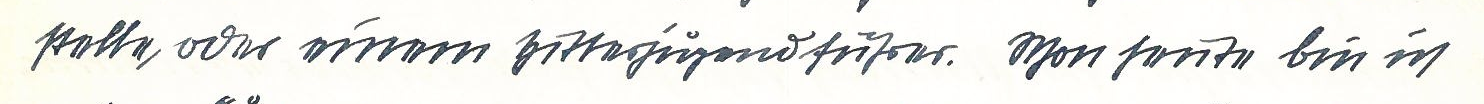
stelle, oder einem Hitlerjugendführer. Schon heute bin ich
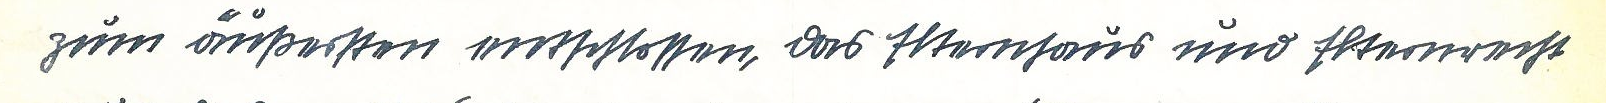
zum äußersten entschlossen, das Elternhaus und Elternrecht
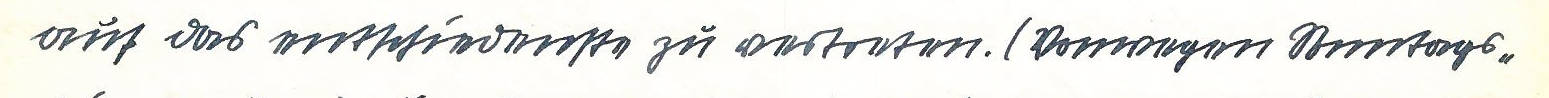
auf das entschiedenste zu vertreten. (Von wegen Sonntags¬
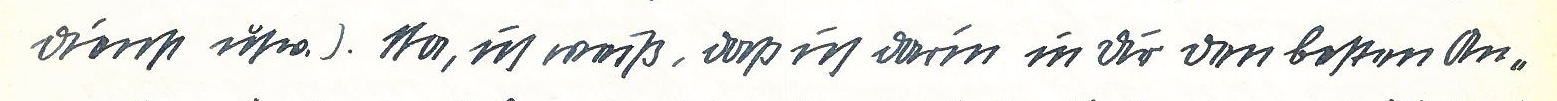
dienst u. s. w.). Na, ich weiß, daß ich darin in Dir den besten An¬
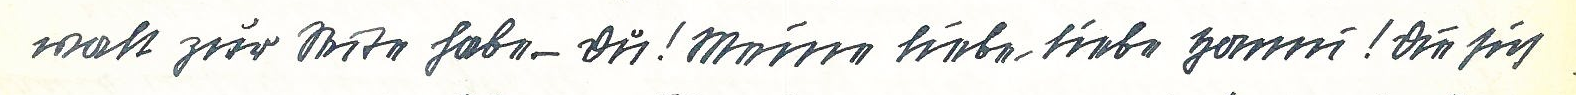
walt zur Seite habe – Du! Meine liebe, liebe! Die sich
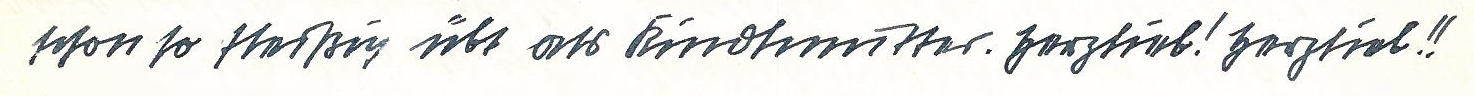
schon so fleißig übt als Kindlmutter. Herzlieb! Herzlieb!!
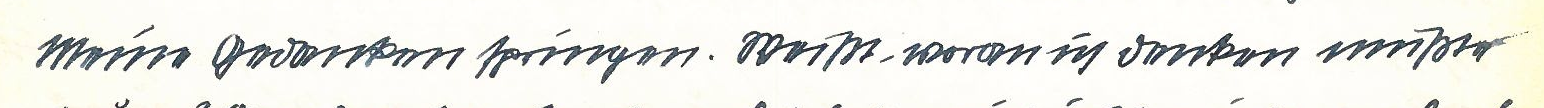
Meine Gedanken springen. Weißt, woran ich denken mußte
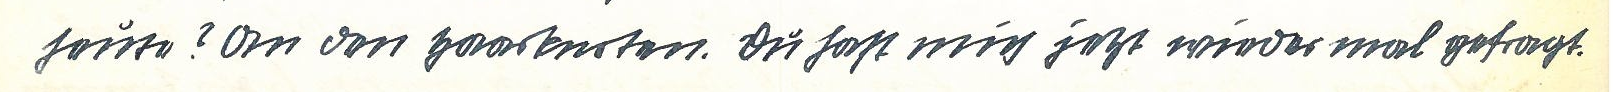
heute? An den Haarknoten. Du hast mich jetzt wieder mal gefragt.
